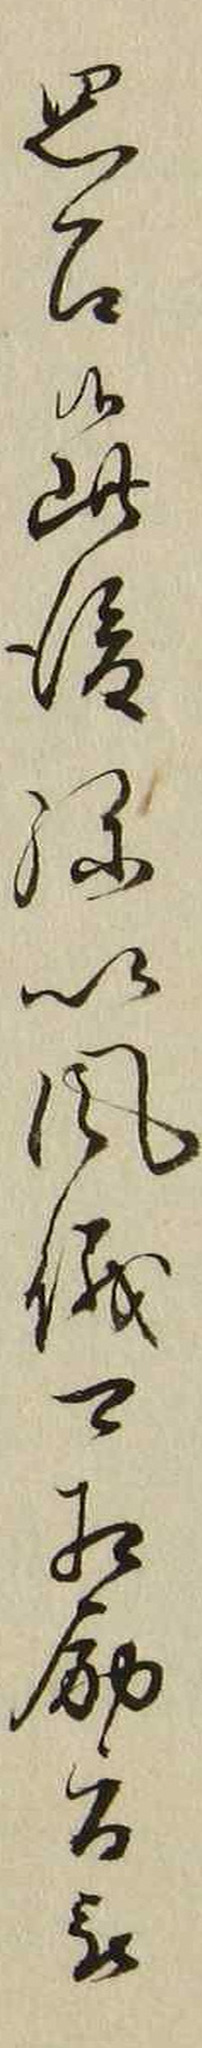思召候此後弥以風儀可相励旨被
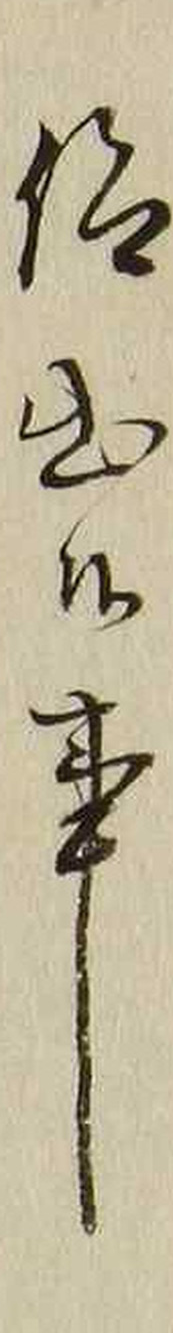仰出候事
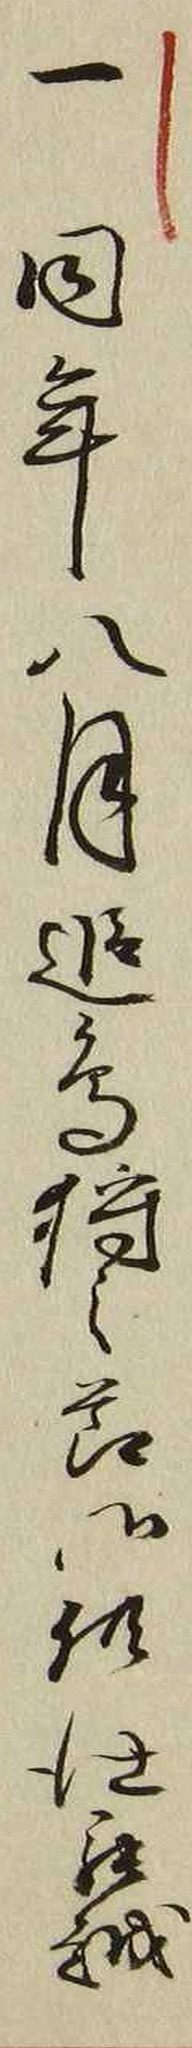一同年八月追鳥狩の節御供仕罷越
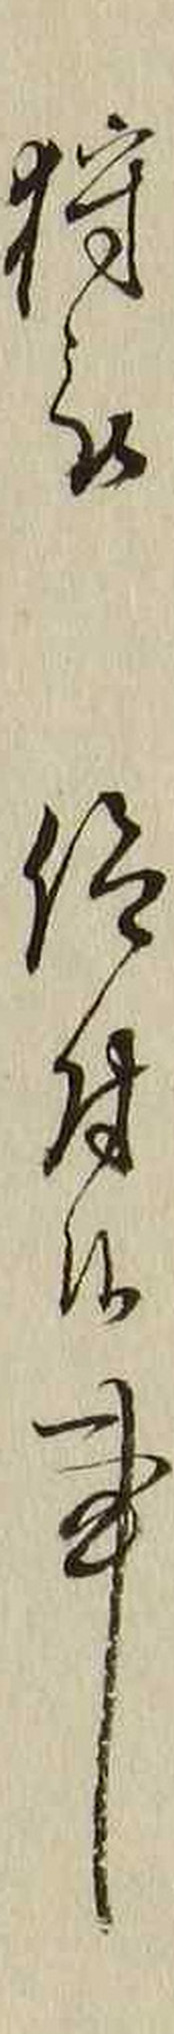狩被仰付候事
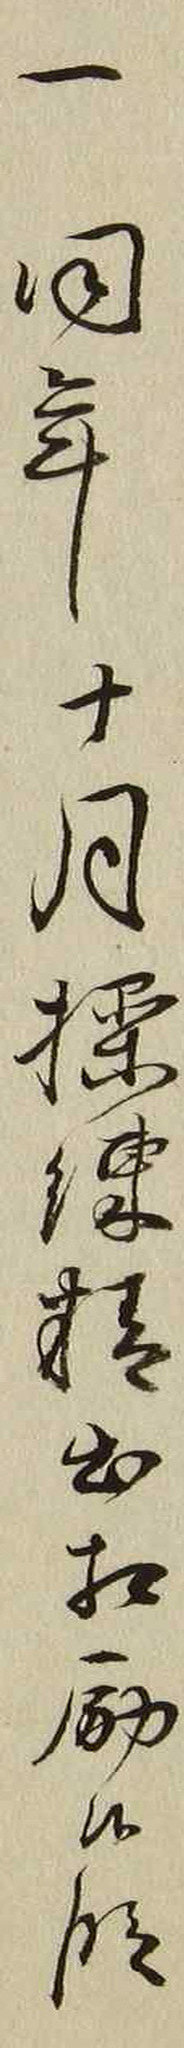一同年十月操練精出相励候段
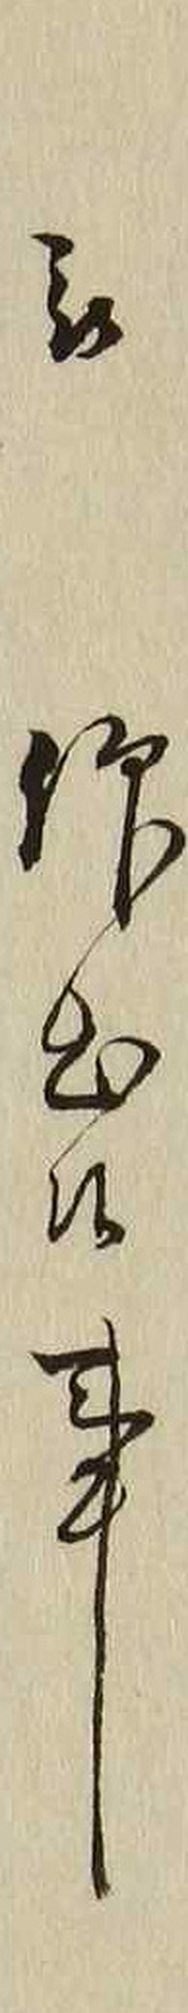被仰出候事
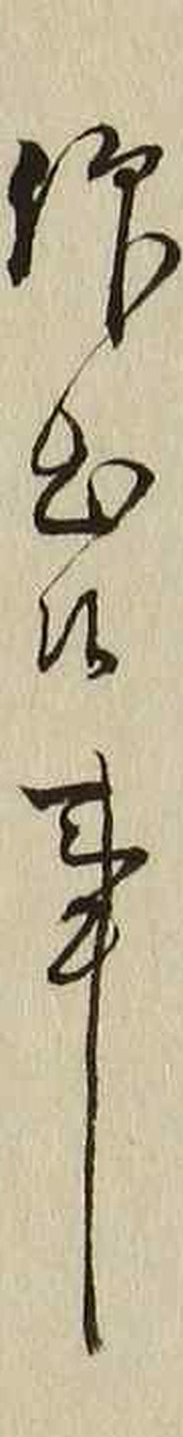仰出候事
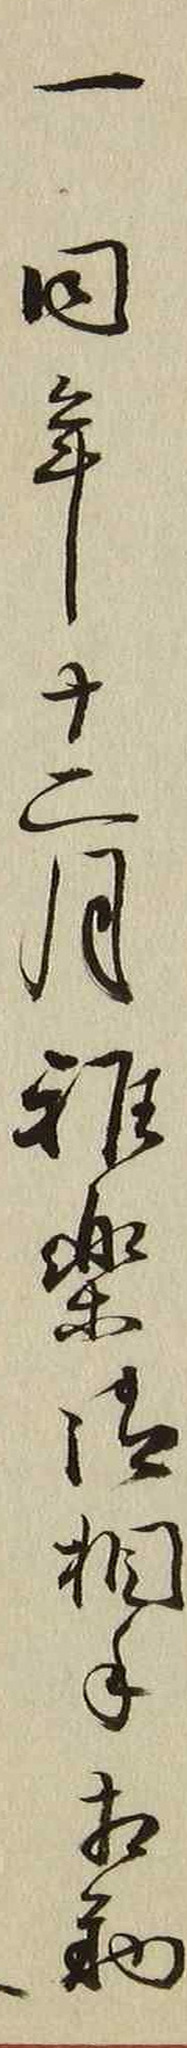一同年十二月雅楽御相手相勤
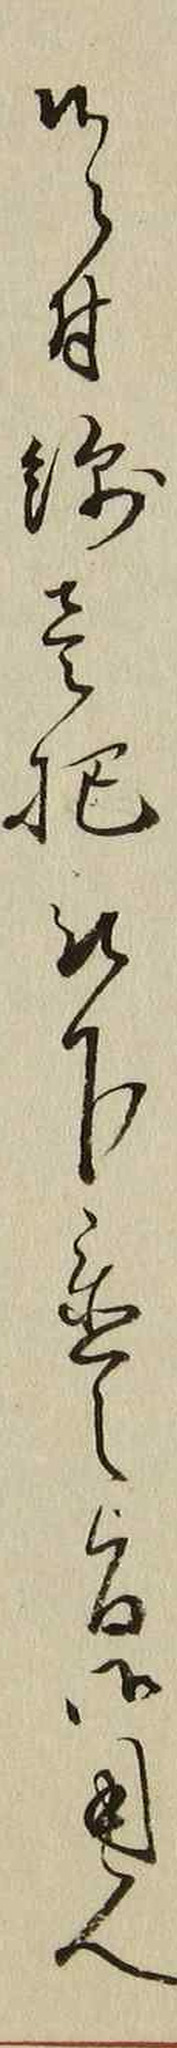候に付綿壱把被下置の旨御用人
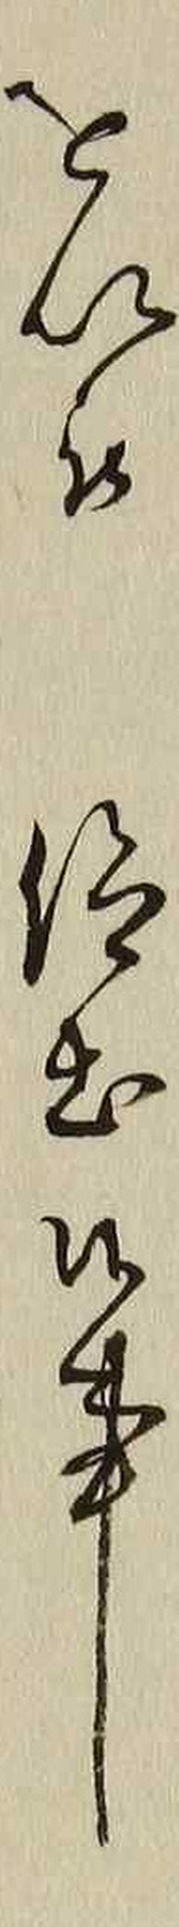を以被仰出候事
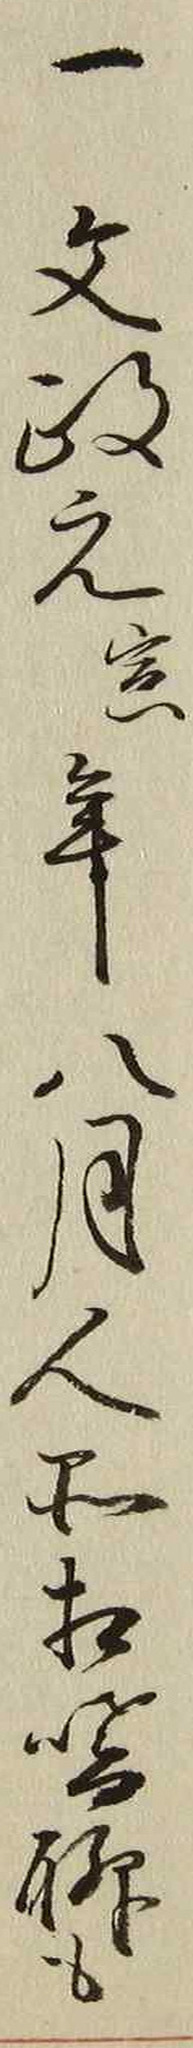一文政元寅年八月人品相嗜聊も
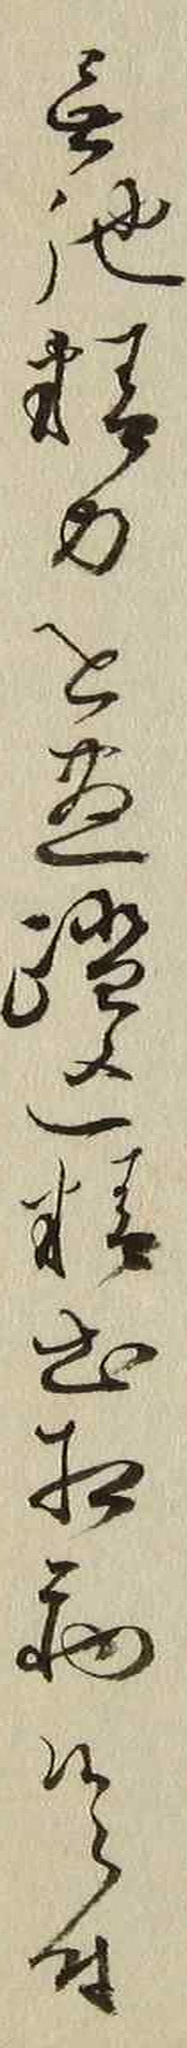無弛精力を尽踏込精出相勤候に付
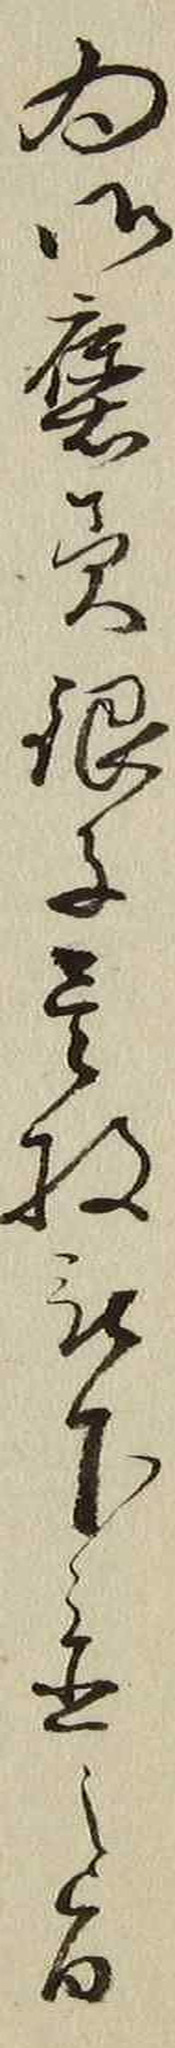為御褒美銀子壱枚被下置の旨
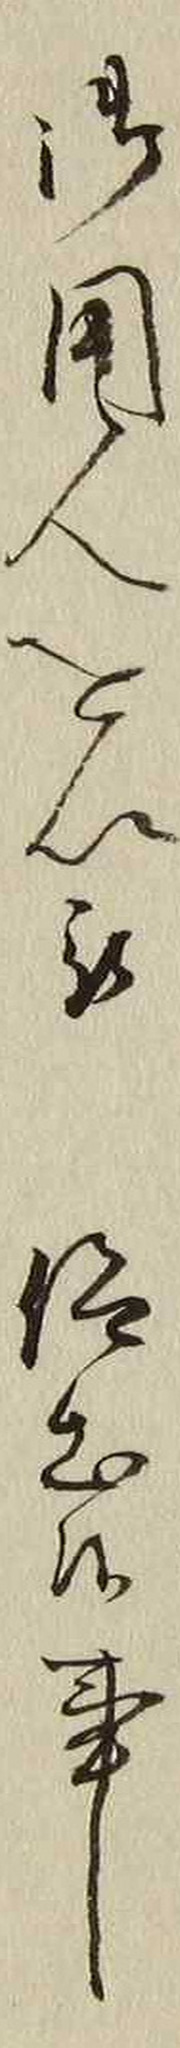御用人を以被仰出候事
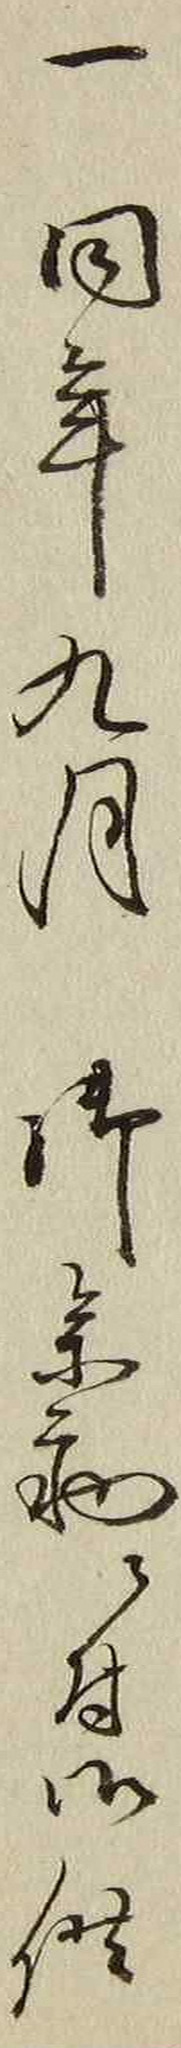一同年九月御参勤に付御供
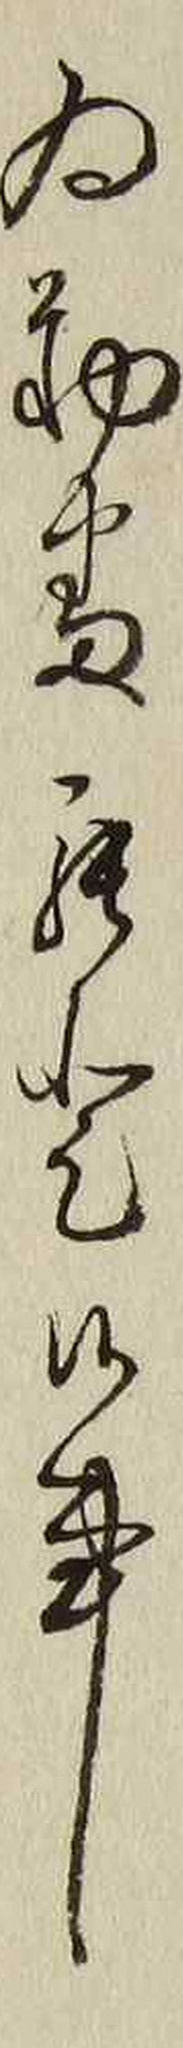為勤番罷登候事
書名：諸士系譜　巻之1　い之部1
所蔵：会津若松市立会津図書館
